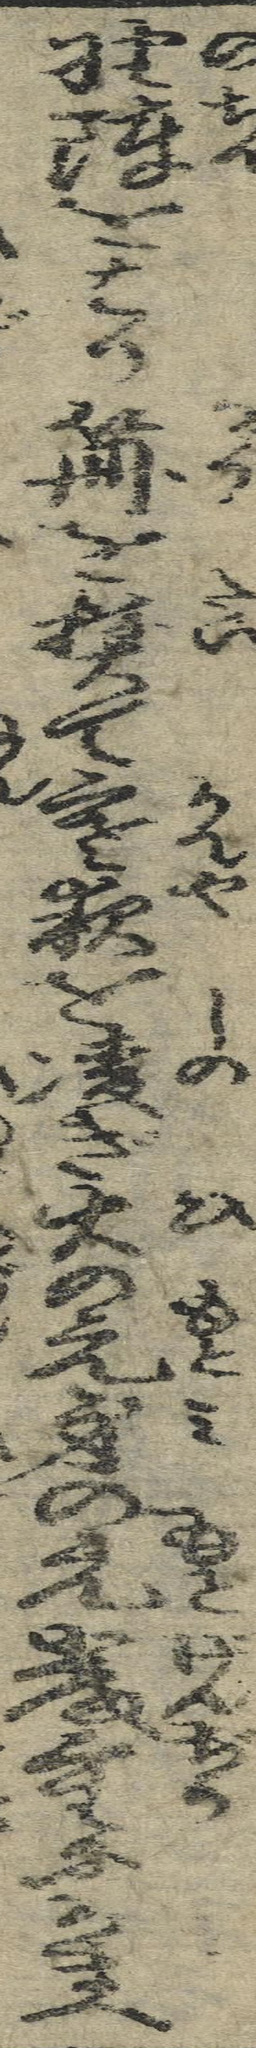野陣をはり笧を焚て寒夜を凌ぎ火の元身の元厳重にかまへ
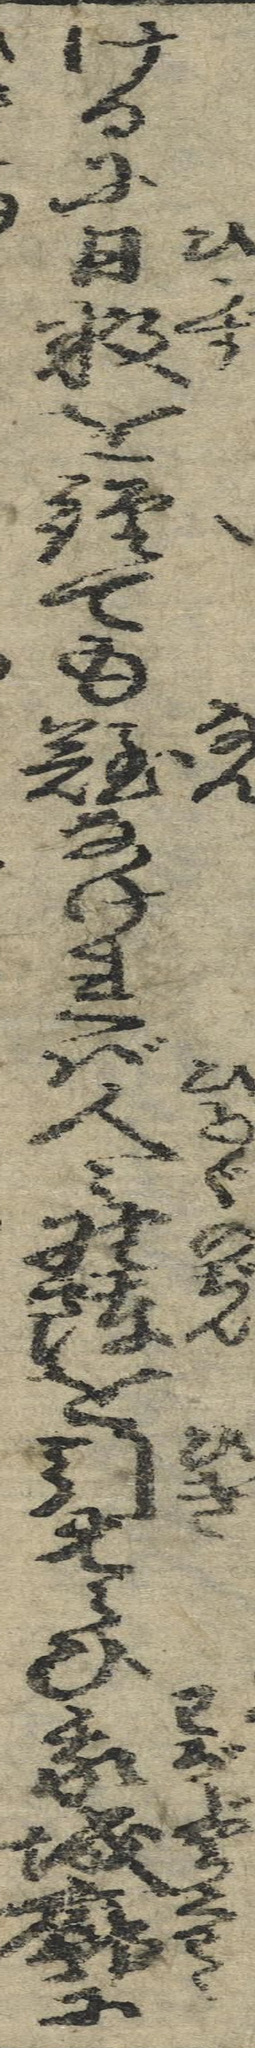けるに日数を経ても難なければ人々野陣を引はらひ我城郭に
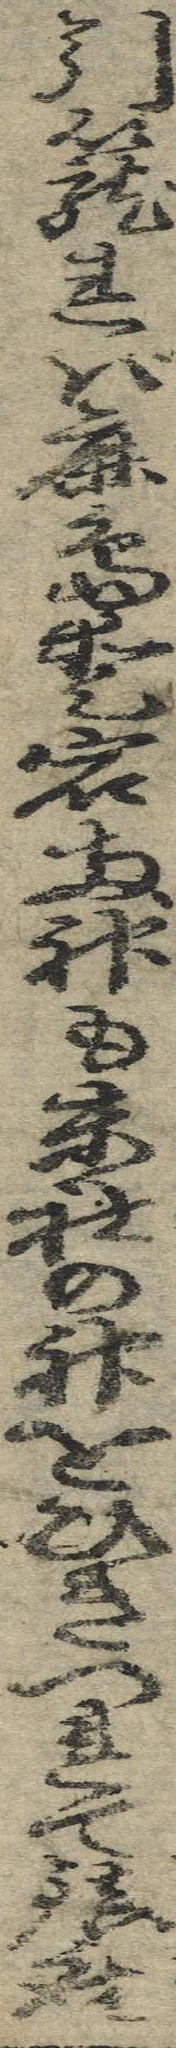引篭れば鹿島愛宕両神も末社の神をひきつれて鎮座
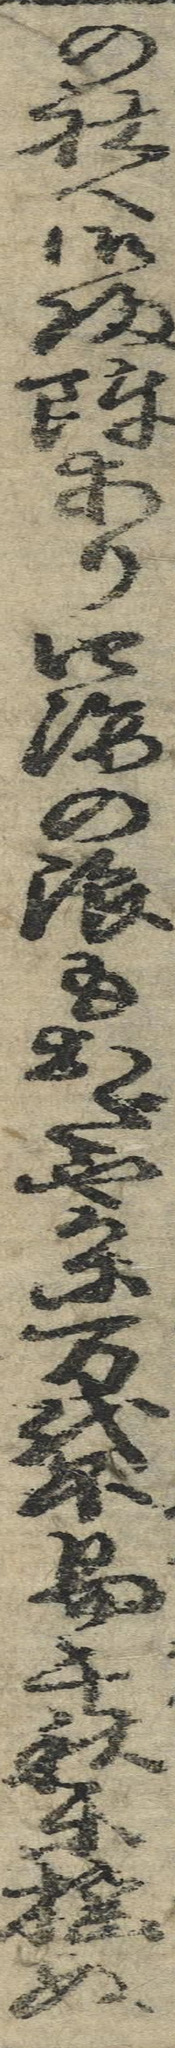の社へ御帰陣あり四海の浪もおだやかに万代不易千秋楽に揺ぬ
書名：鯰太平記混雑ばなし
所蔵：東京大学地震研究所図書室 Earthquake Research Institute Library, The University of Tokyo, JAPAN
